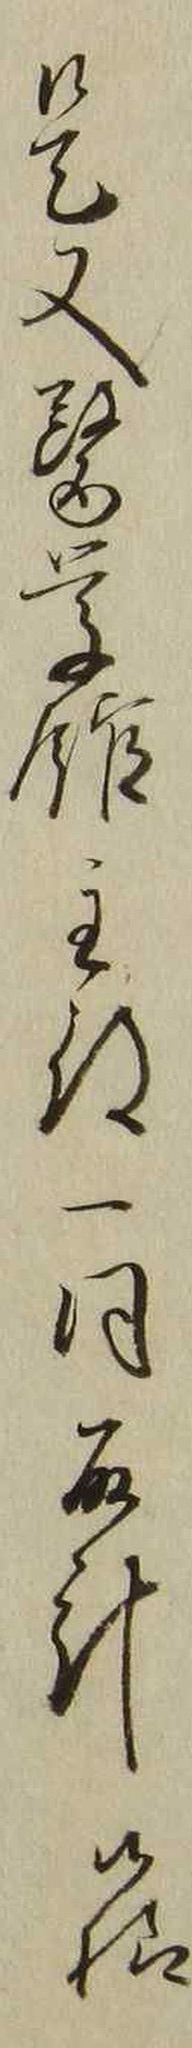是又医学館主役一同取計候様
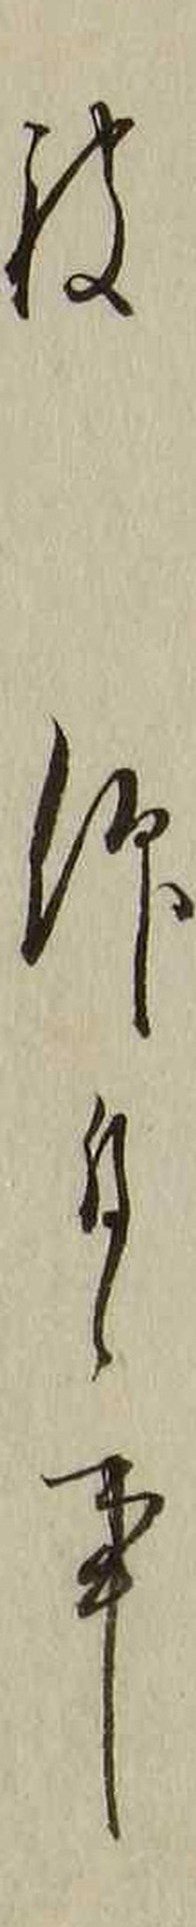被仰付候事
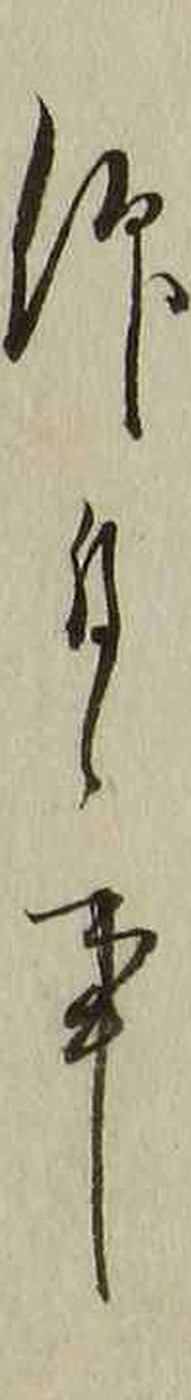仰付候事
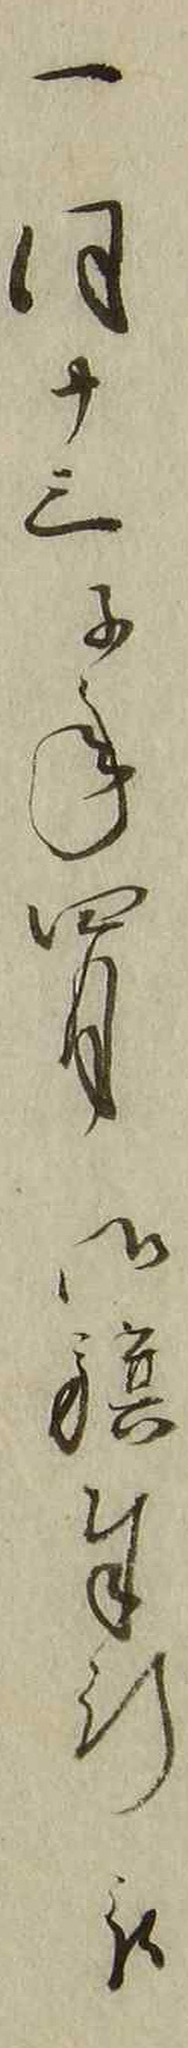一同十三子年四月御旗奉行被
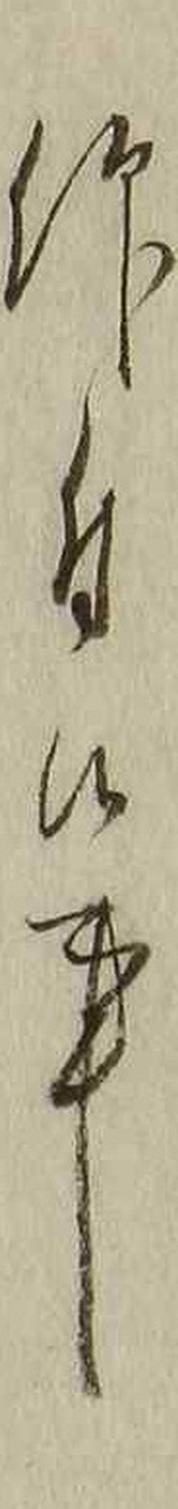仰付候事
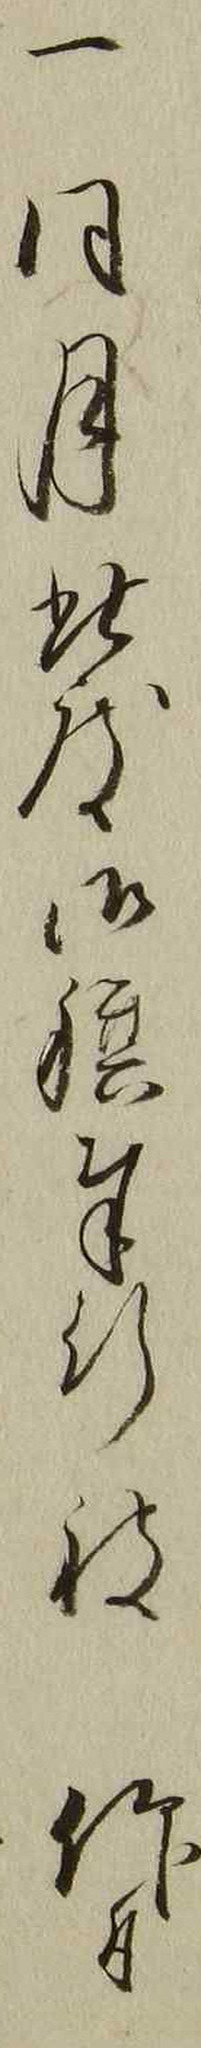一同月此度御旗奉行被仰付
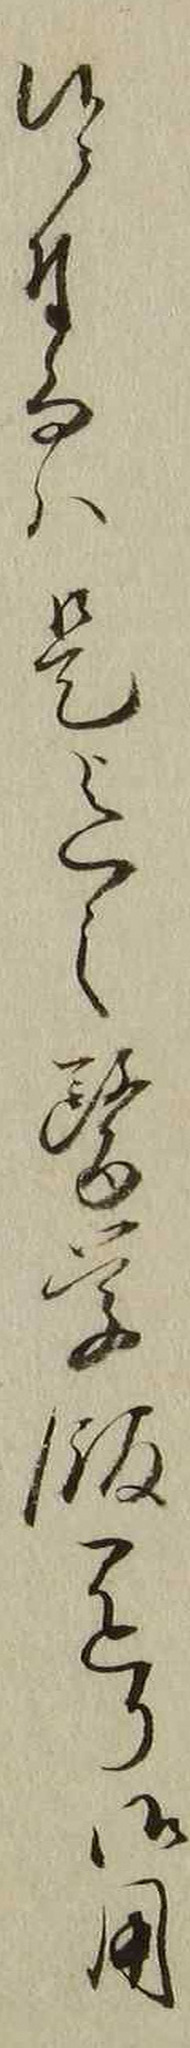候ニ付而ハ是迄之医学館懸り御用
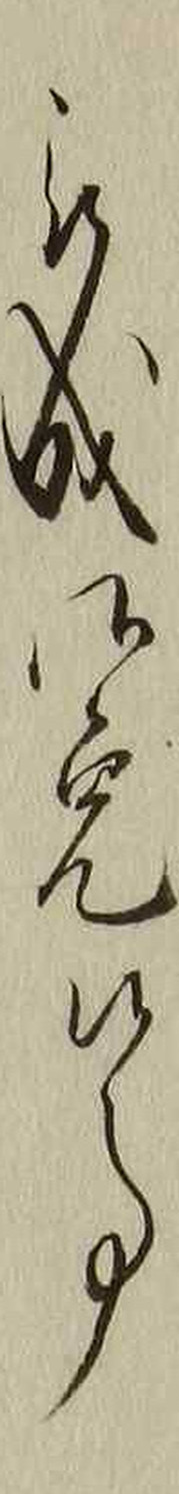被成御免候事
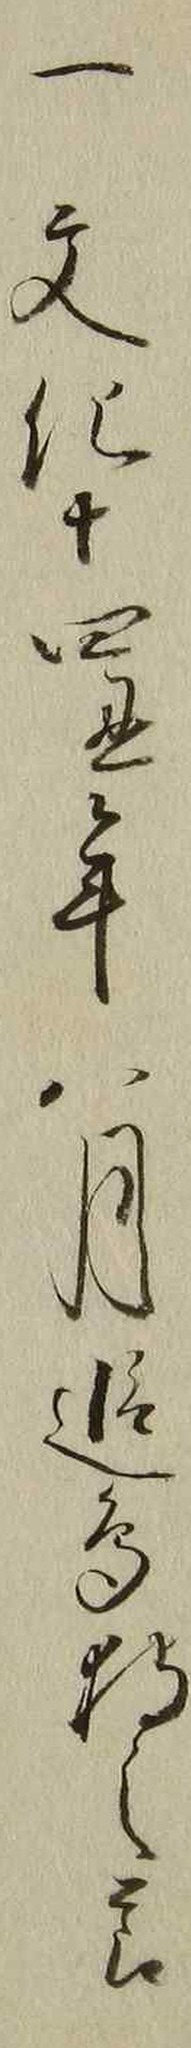一文化十四丑年八月追鳥狩之節
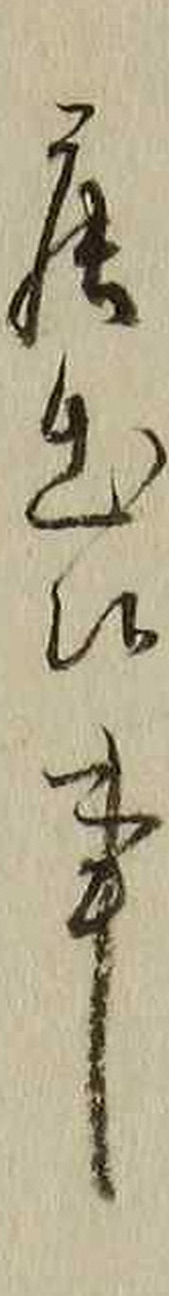罷出候事
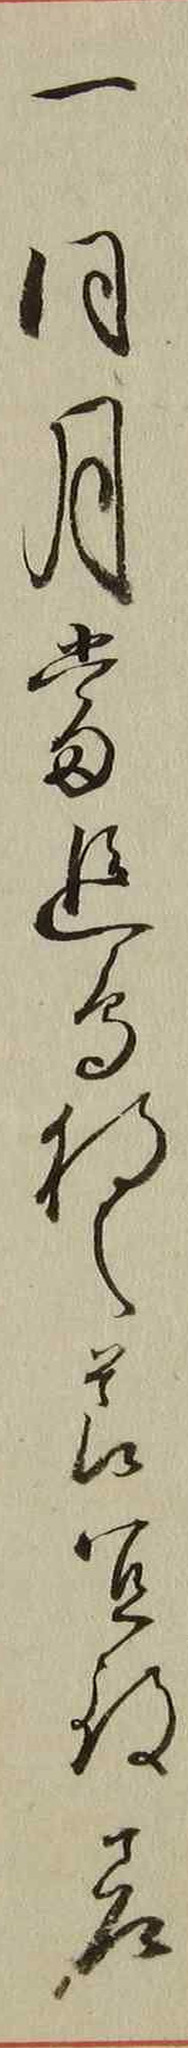一同月当追鳥狩之節宜致差
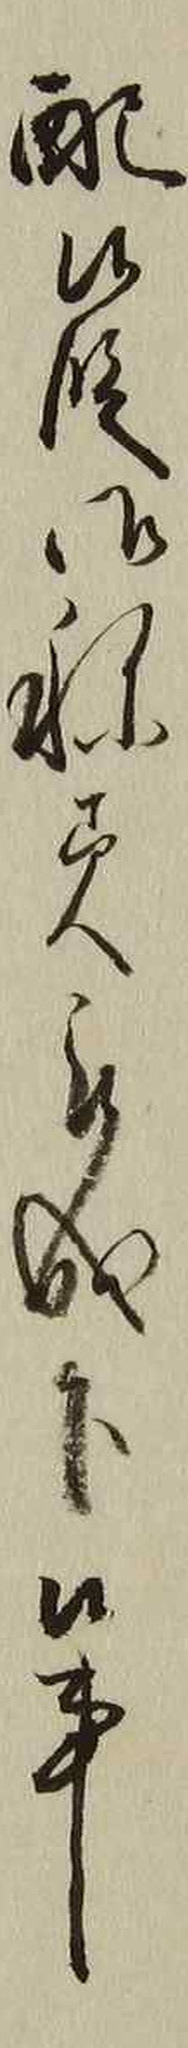配候段御禄美被成下候事
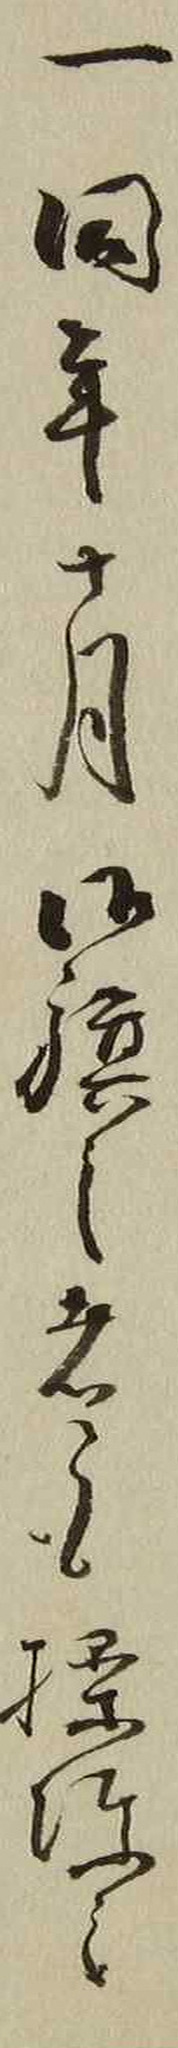一同年十月御旗之者へも操陣之
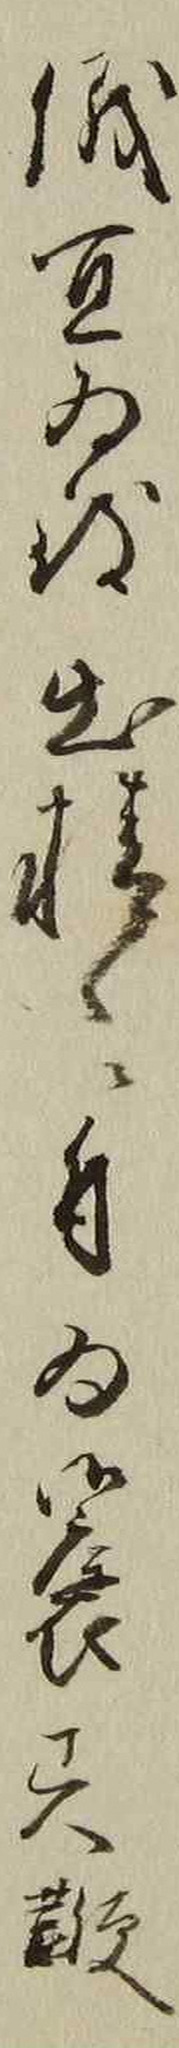儀宜為致出精候ニ付為御褒美鞭
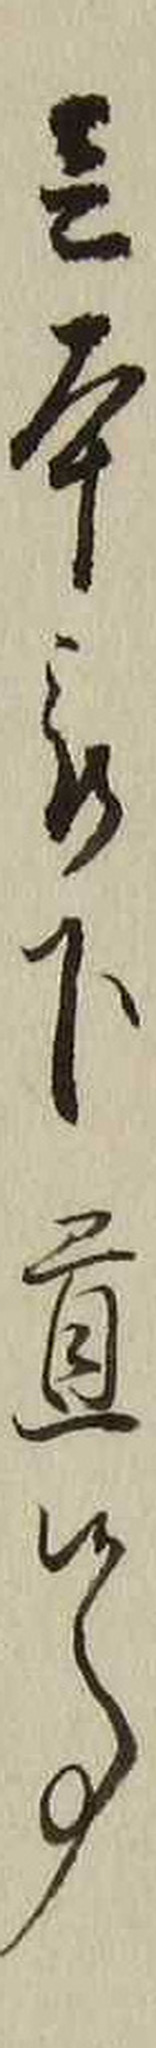壱本被下置候事
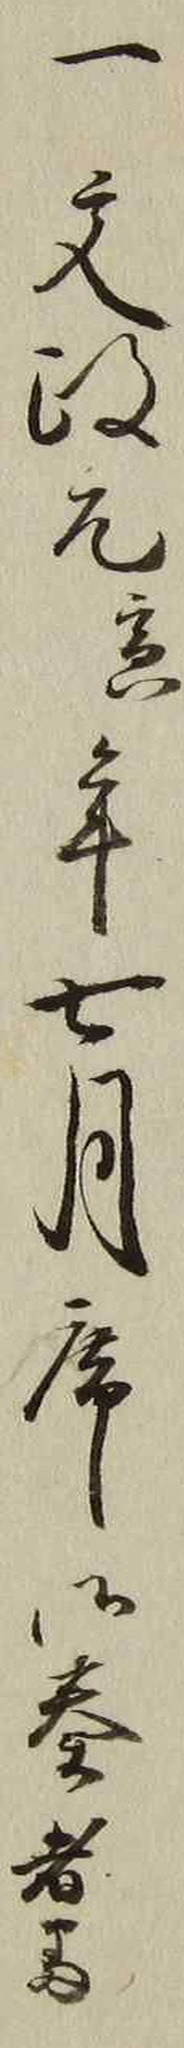一文政元寅年七月席御奏者番
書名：諸士系譜　巻之2　い之部2
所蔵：会津若松市立会津図書館
